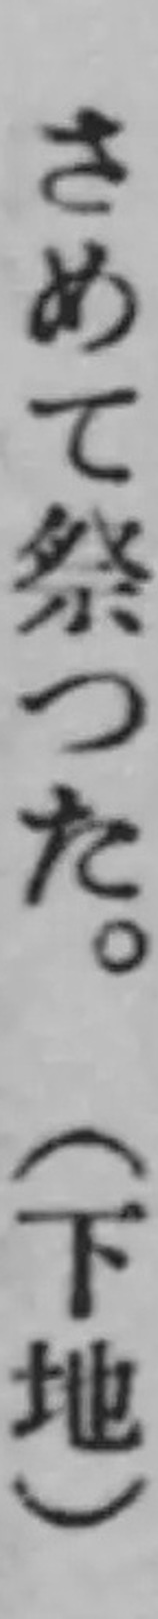さめて祭つた、(下地)
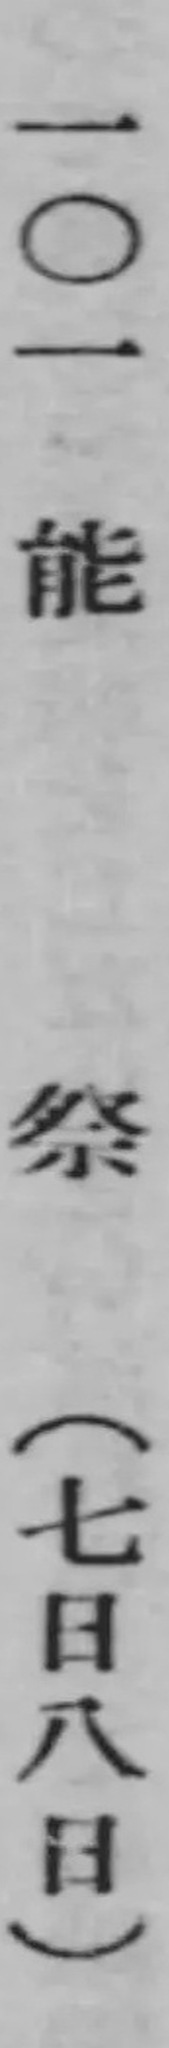一〇一能祭(七日八日)
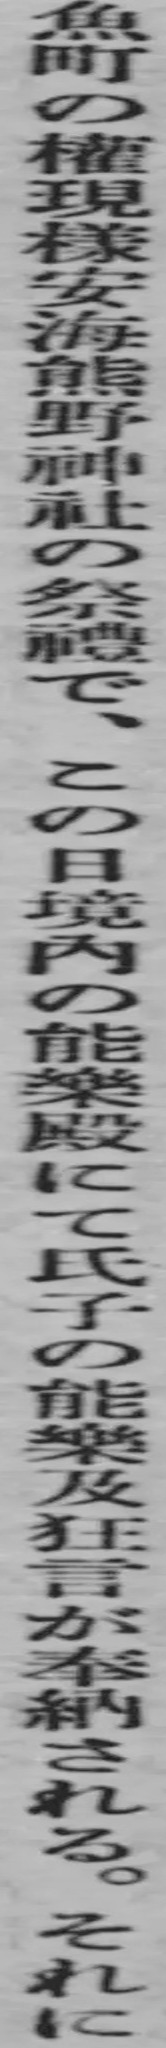魚町の權現様安海熊野神社の祭禮で、この日境内の能樂殿にて氏子の能樂及狂言が奉納される。それに
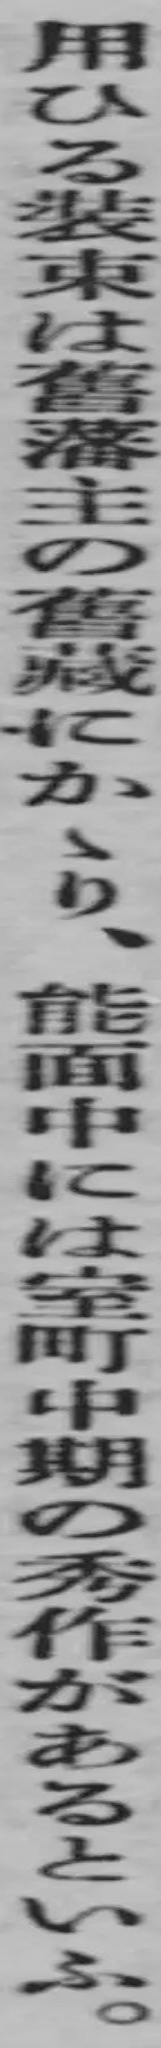用ひる裝束は舊藩主の舊藏にかゝり、能面中には室町中期の秀作があるといふ。
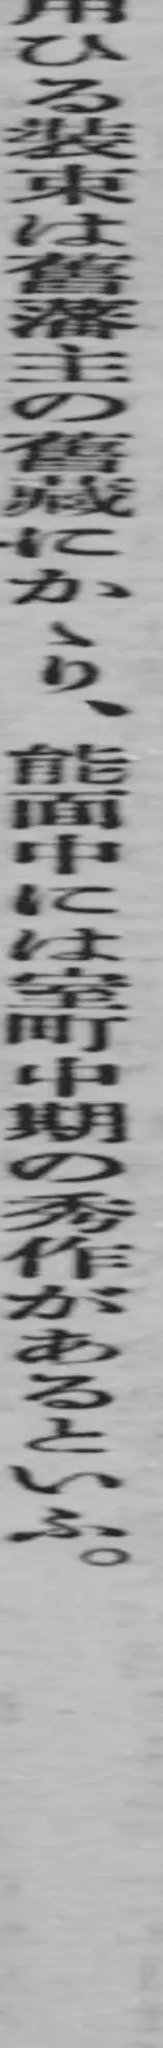用ひる裝束は舊藩主の舊藏にかゝり、能面中には室町中期の秀作があるといふ。

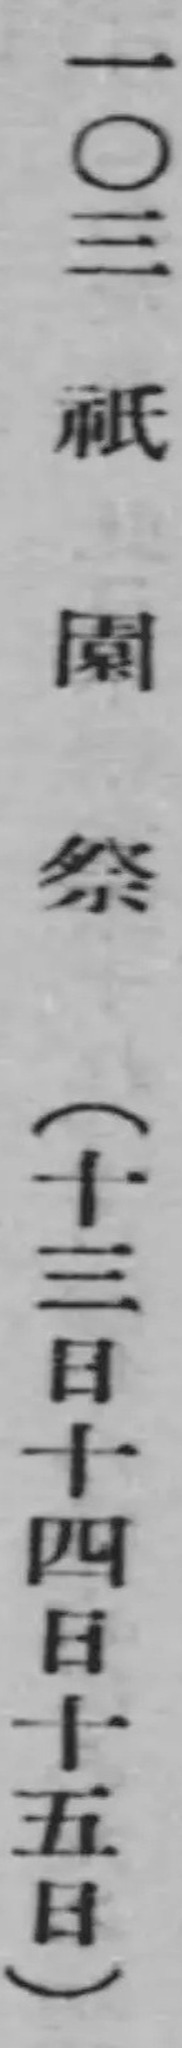一〇三祇園祭(十三日十四日十五日)
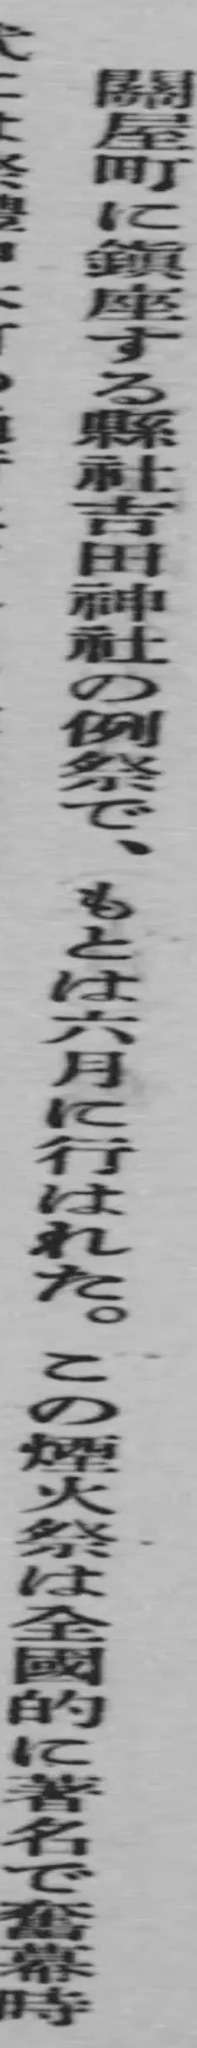關屋町に鎭座する縣社吉田神社の例祭で、もとは六月に行はれた。この煙火祭は全國的に著名で舊幕時
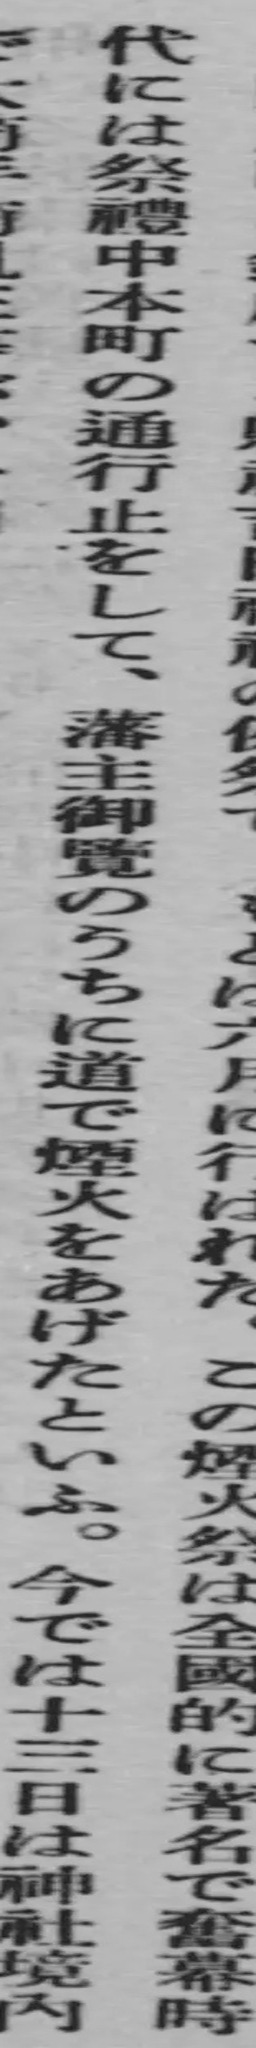代には祭禮中本町の通行止をして、藩主御覧のうちに道で煙火をあげたといふ。今では十三日は神社境内
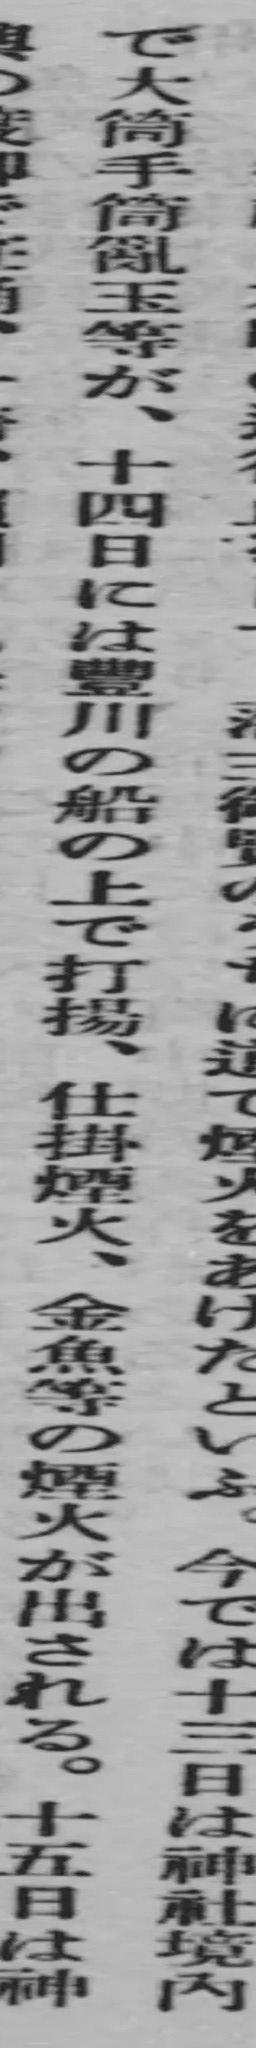で大筒手筒亂玉等が、十四日には豐川の船の上で打揚、仕掛煙火、金魚等の煙火が出される。十五日は神
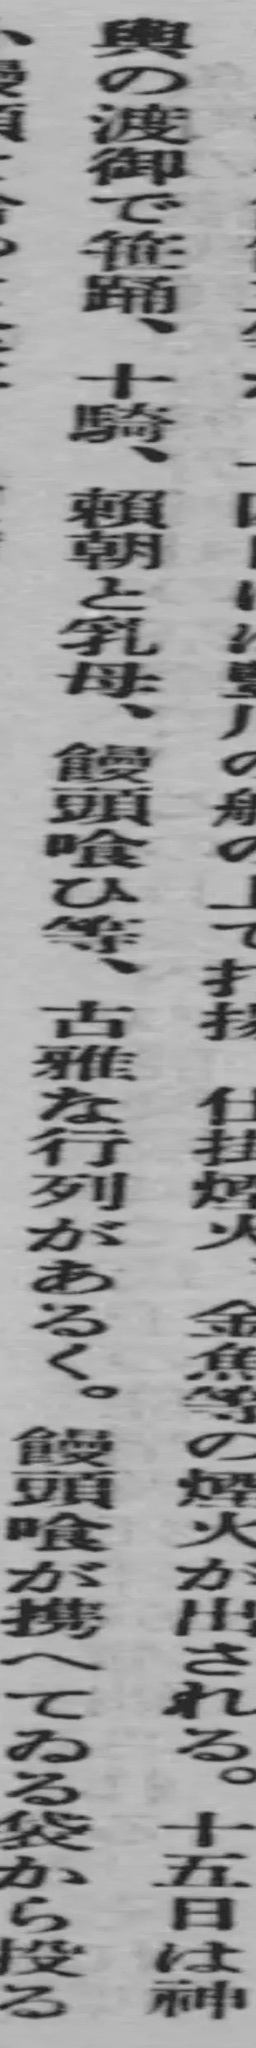輿の渡御で笹踊、十騎、賴朝と乳母、饅頭喰ひ等、古雅な行列があるく、饅頭喰が携へてゐる袋から投る
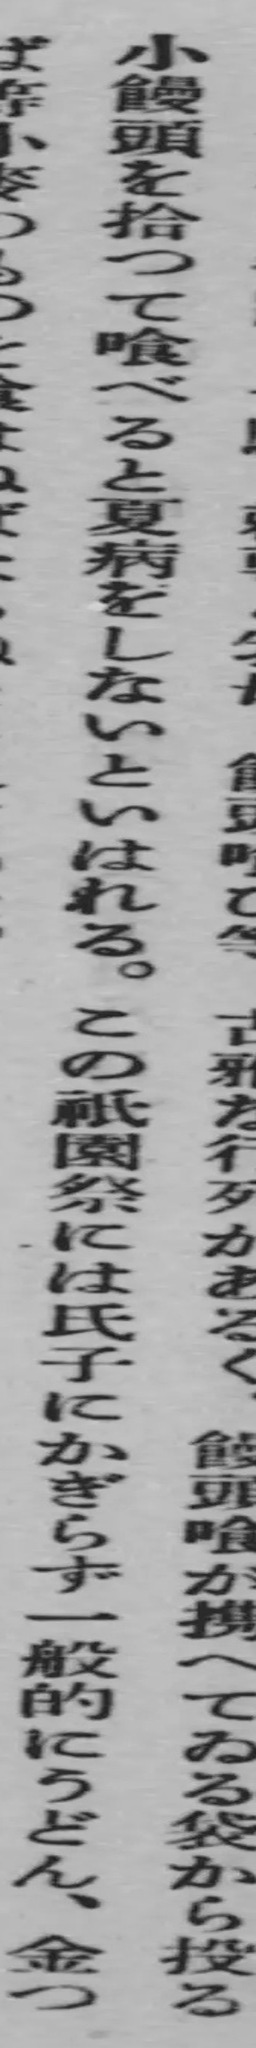小饅頭を拾つて喰べると夏病をしないといはれる。この祇園祭には氏子にかぎらず一般的にうどん、金つ
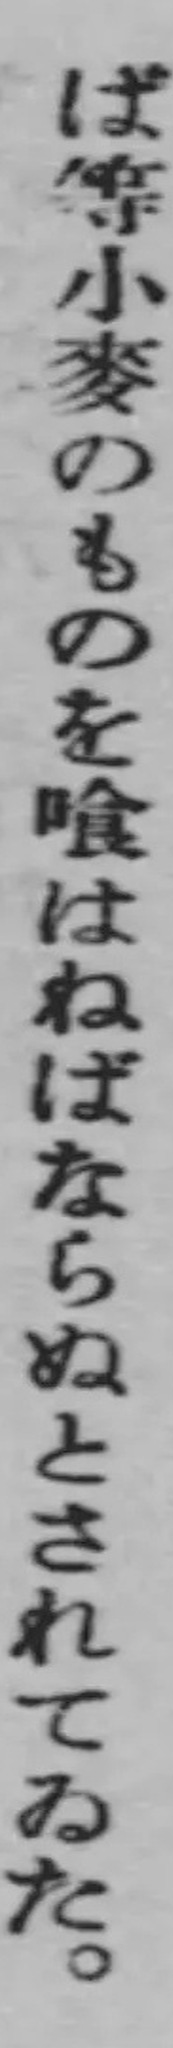ば等小麥のものを喰はねばならぬとされてゐた。
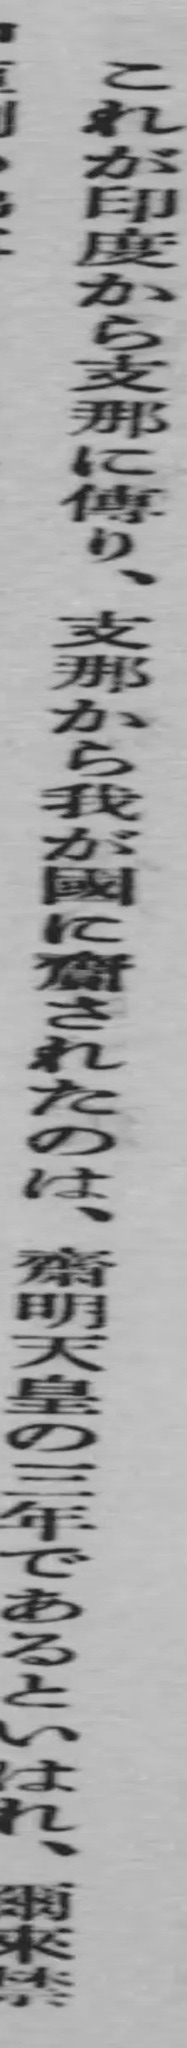これが印度から支那に傳り、支那から我が國に齎されたのは、齋明天皇の三年であるといはれ、爾來禁
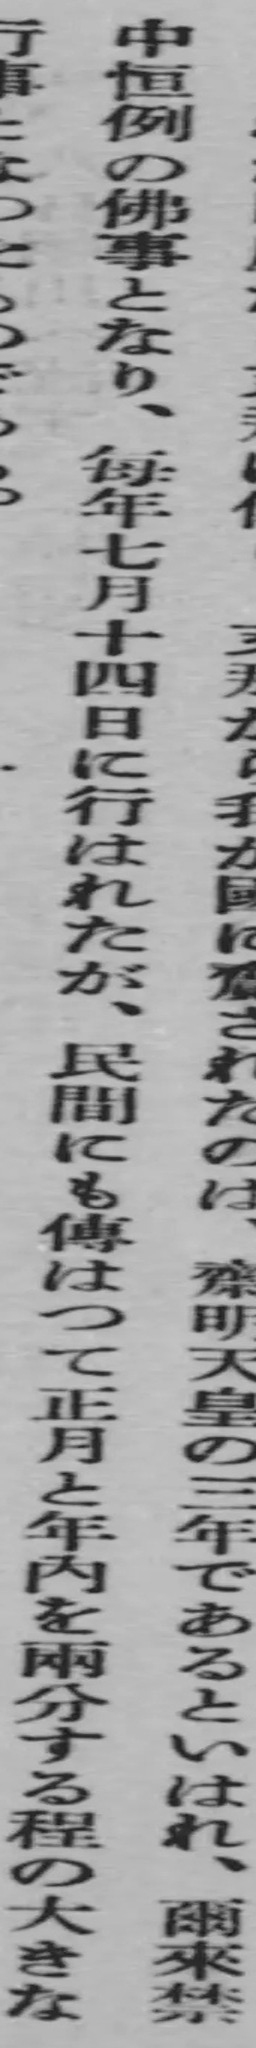中恒例の佛事となり、每年七月十四日に行はれたが、民間にも傳はつて正月と年内を兩分する程の大きな
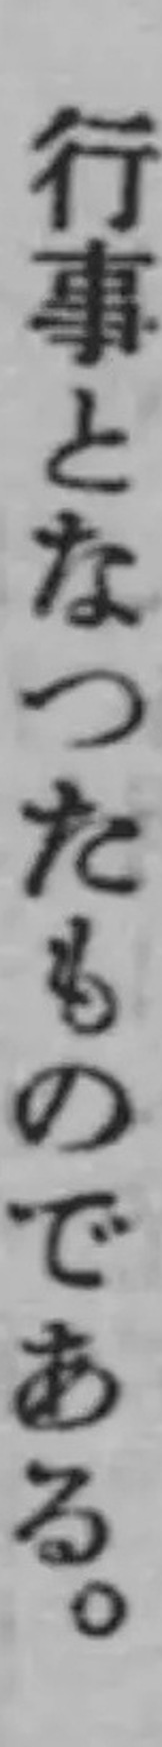行事となつたものである。
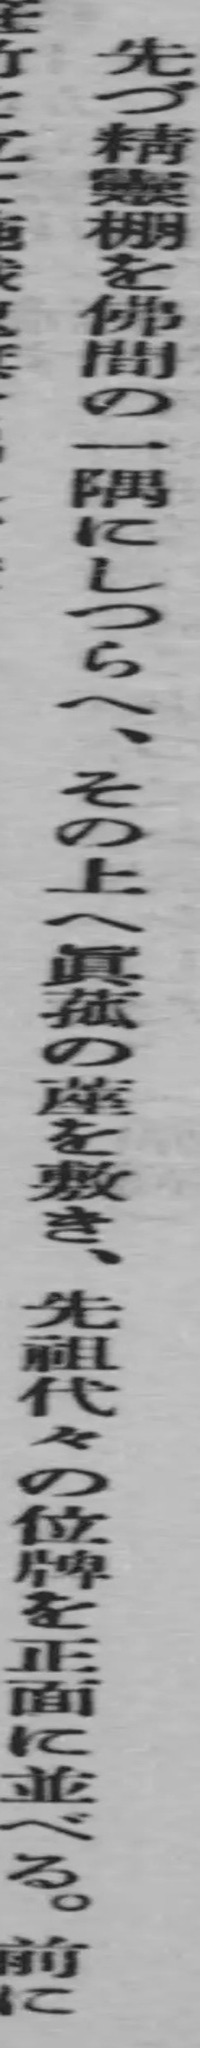先づ精靈棚を佛間の一隅にしつらへ、その上へ眞菰の蓙を敷き、先祖代々の位牌を正面に並べる。前に
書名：豊橋の年中行事
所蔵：国立国会図書館 National Diet Library, JAPAN
